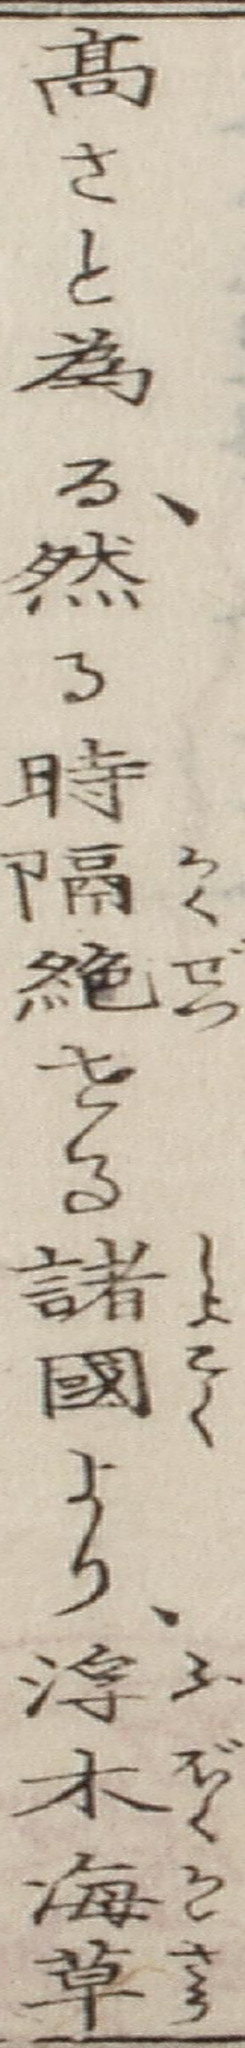高さと為る、然る時隔絶せる諸国より、浮木海草
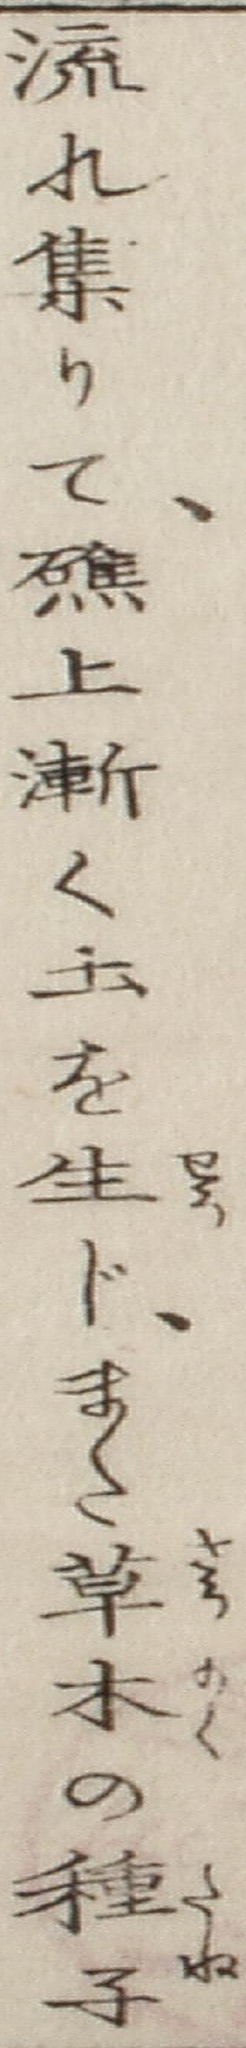流れ集りて、礁上漸く土を生じ、また草木の種子
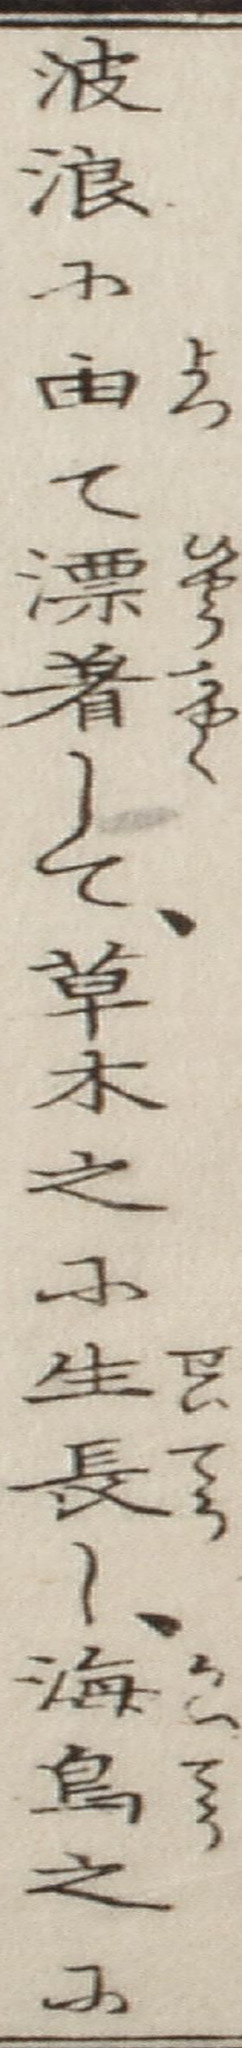波浪に由て漂着して、草木之に生長し、海島之に
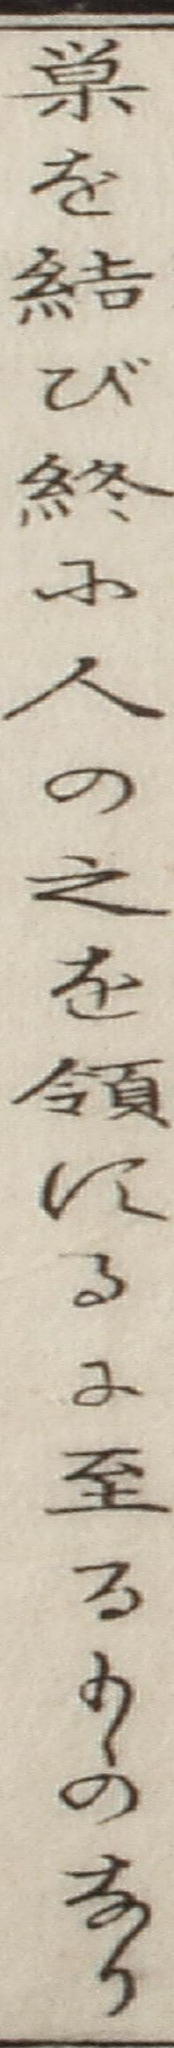巣を結び終に人の之を領するに至るものなり
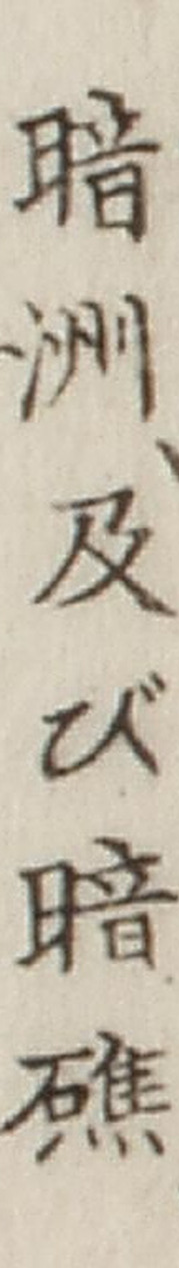暗洲及び暗礁、
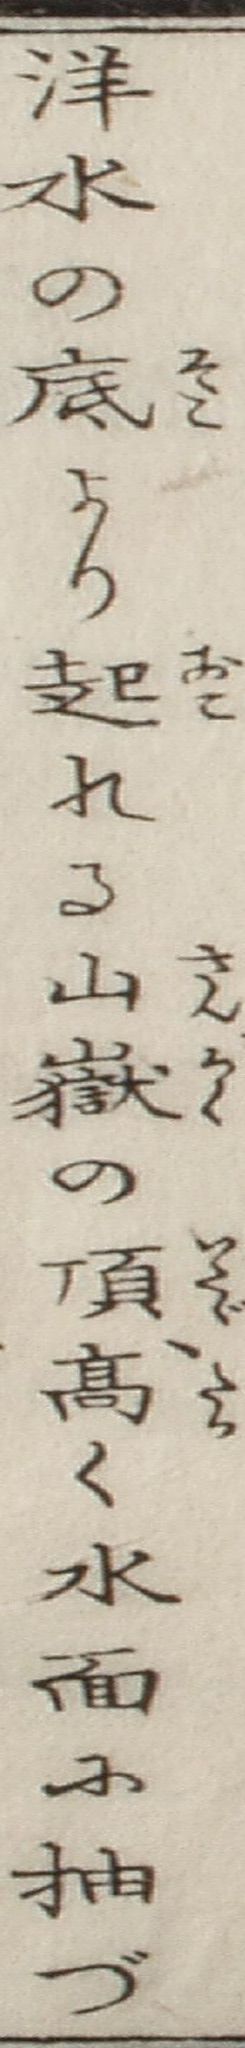洋水の底より起れる山嶽の頂、高く水面に抽づ
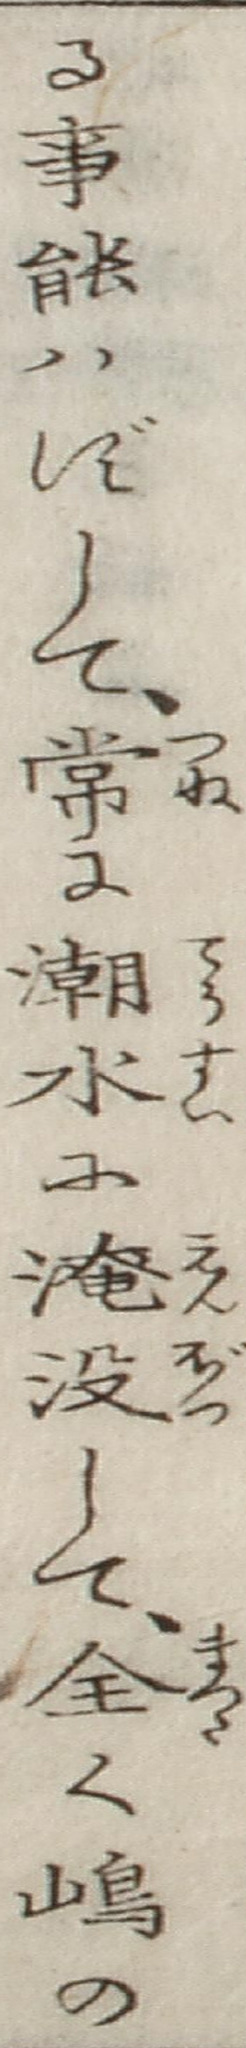る事能はずして、常に潮水に淹没して、全く嶋の
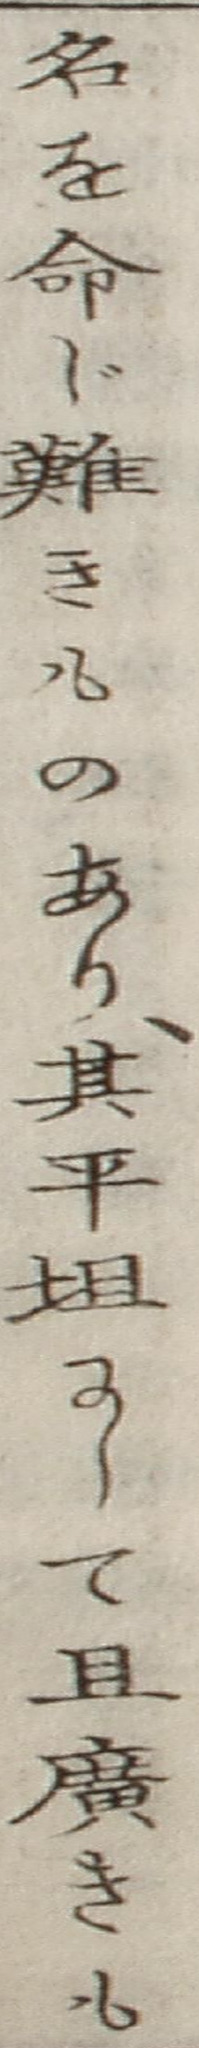名を命じ難きものあり、其平坦にして且広きも

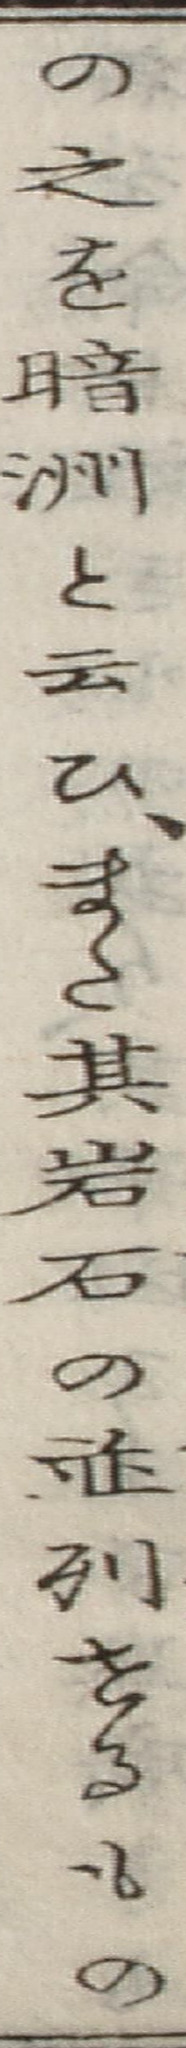の之を暗洲と云ひ、また其岩石の並列せるもの
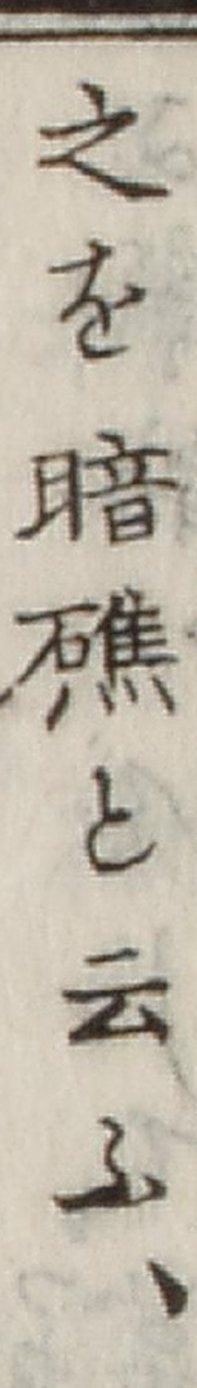之を暗礁と云ふ、
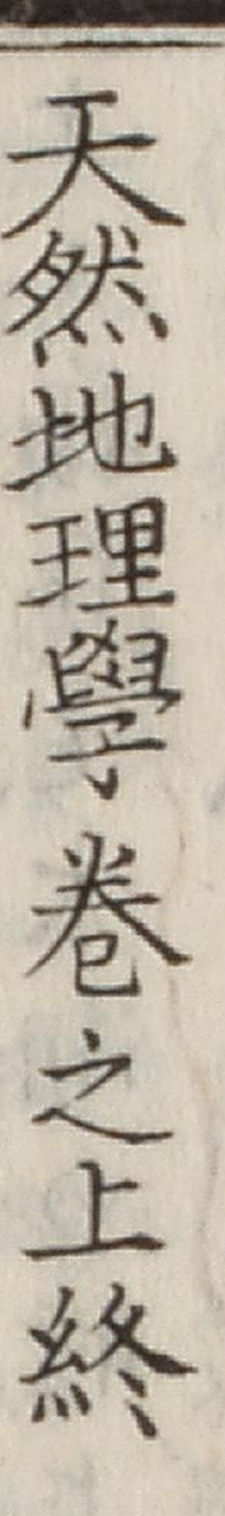天然地理学巻之上終
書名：訓蒙　天然地理學　上
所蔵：東京大学地震研究所図書室 Earthquake Research Institute Library, The University of Tokyo, JAPAN
